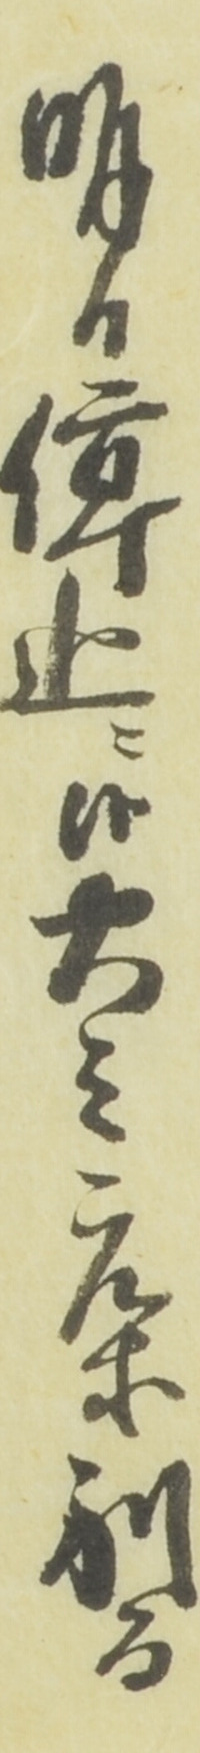明日停止ニ候火之元等別而
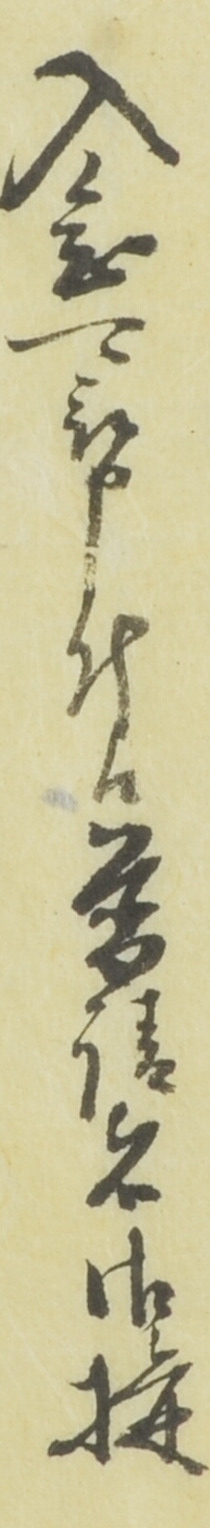入念可被申付候普請は御構
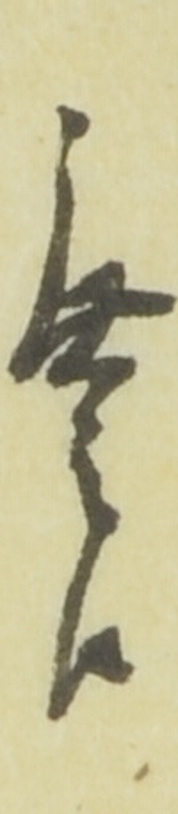無之候
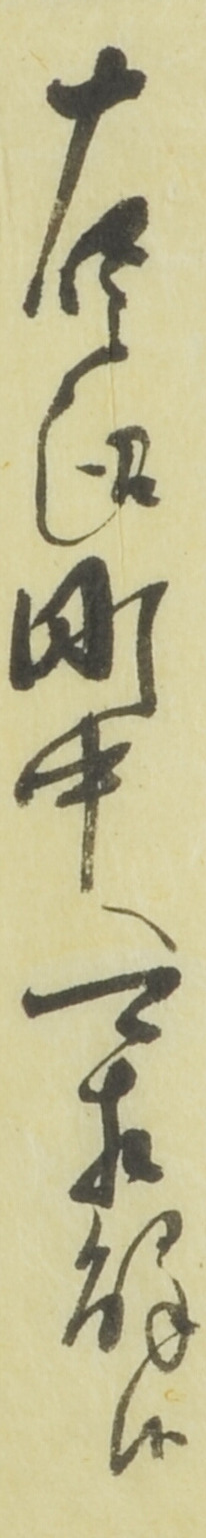右之趣町中へ可相触候
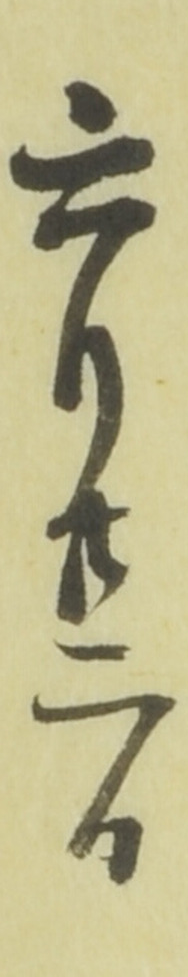六月廿二日
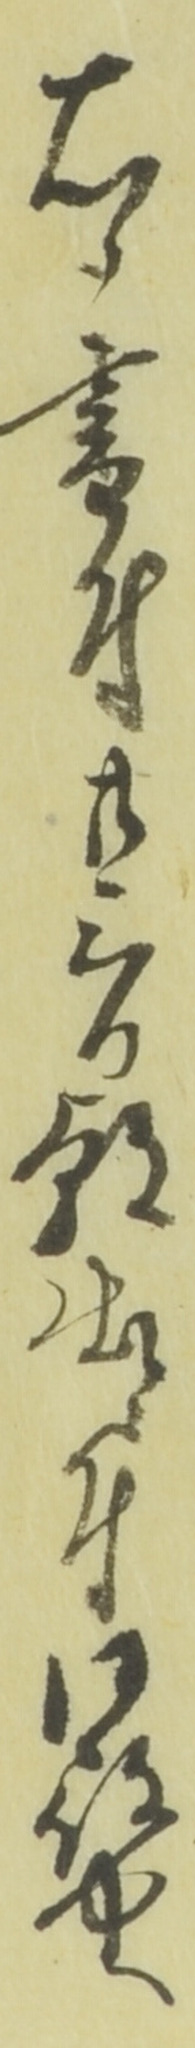右御書付廿三日朝出候ニ付同役中へ
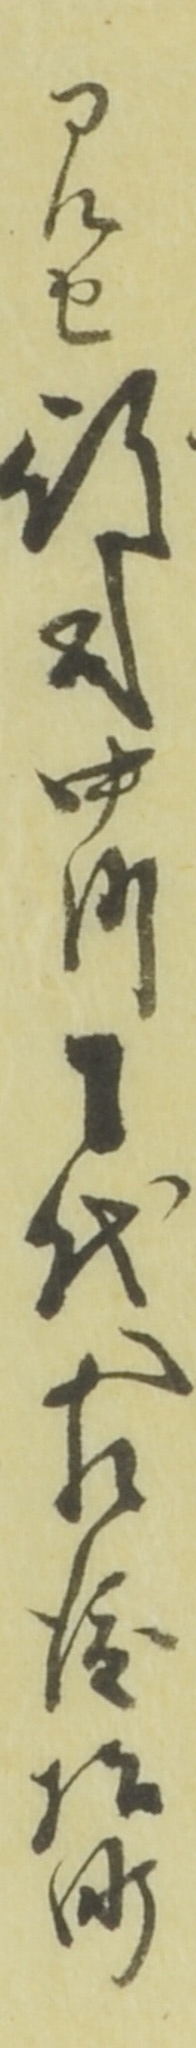見せ行司中町丁代へ相渡拾町

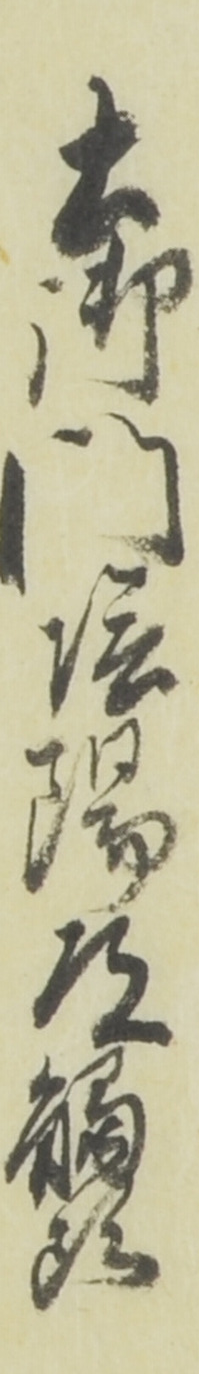土御門陰陽道触頭
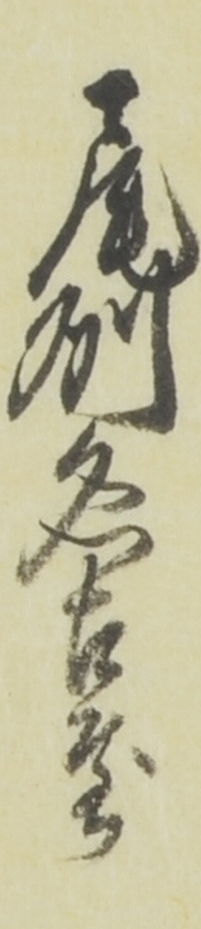尾州名古屋
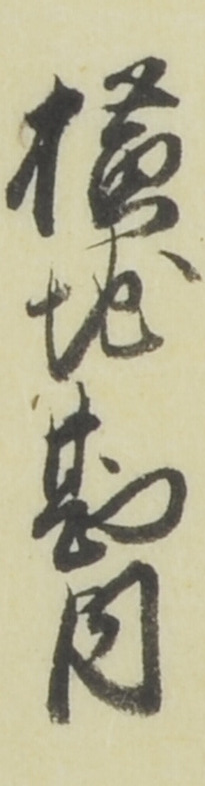横地勘内
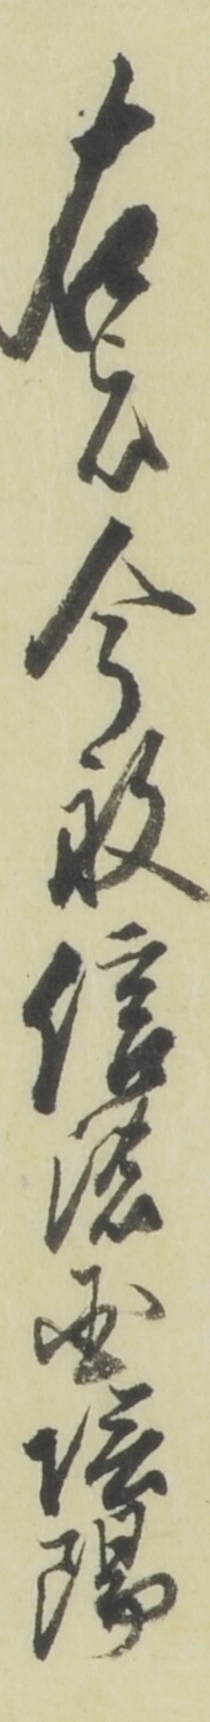右は今般信濃国陰陽
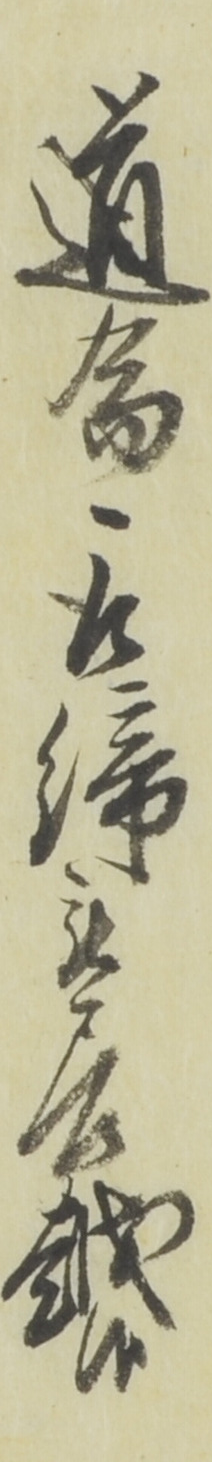道為取締被差越候
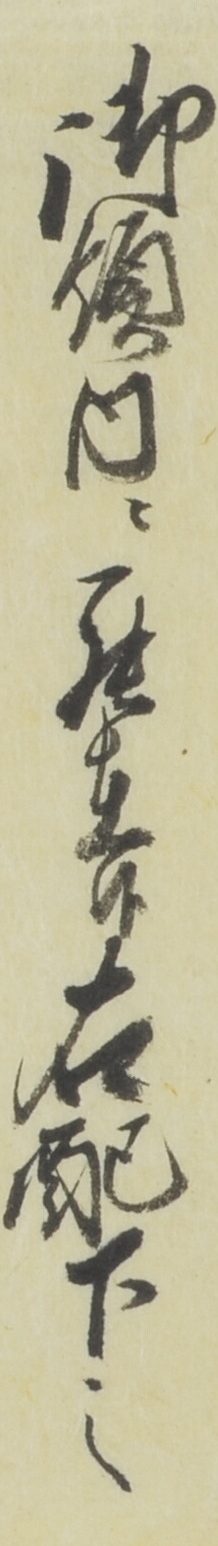御領内ニ罷在候右配下之
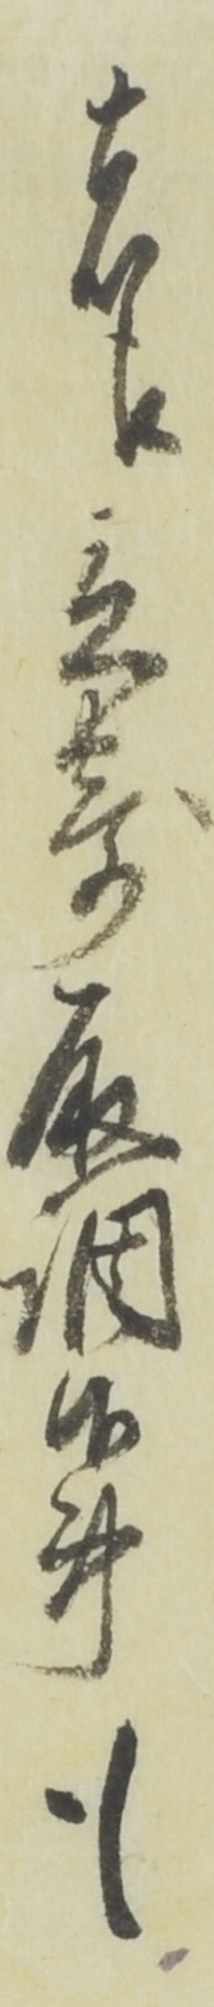者江立寄取調候事も
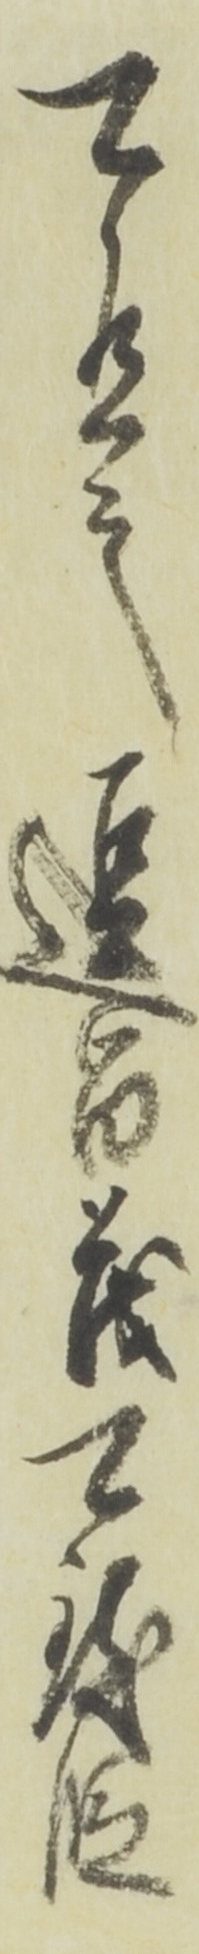可有之逗留も可致段
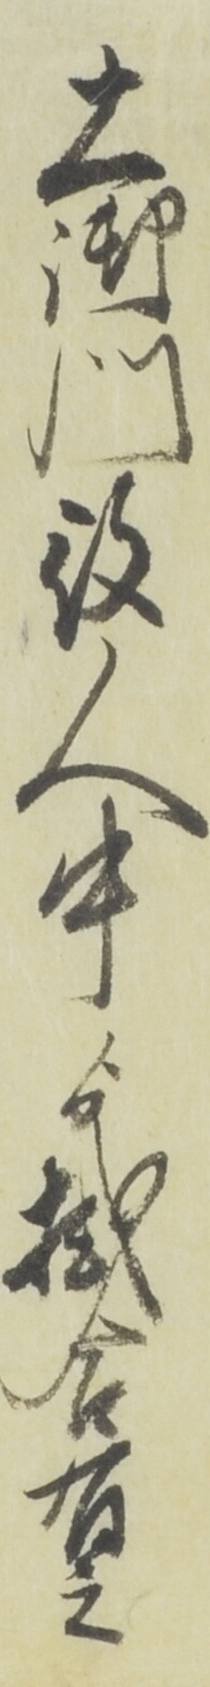土御門役人中ゟ掛合有之
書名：御触書御書附控
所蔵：伊那市立高遠町図書館・合同会社AMANE
